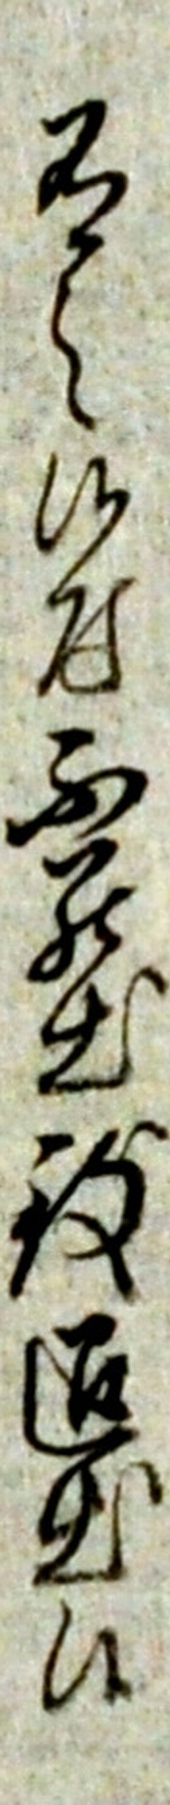有之候付不罷出致退出候
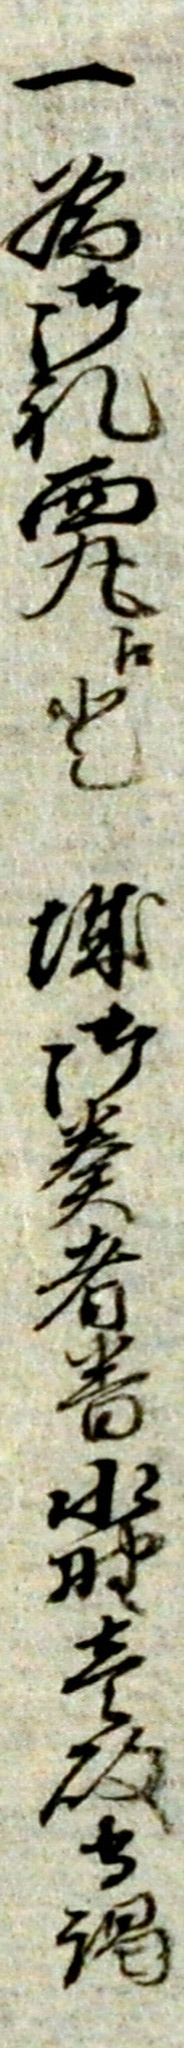一為御礼西丸江登城御奏者番水野壱岐守謁
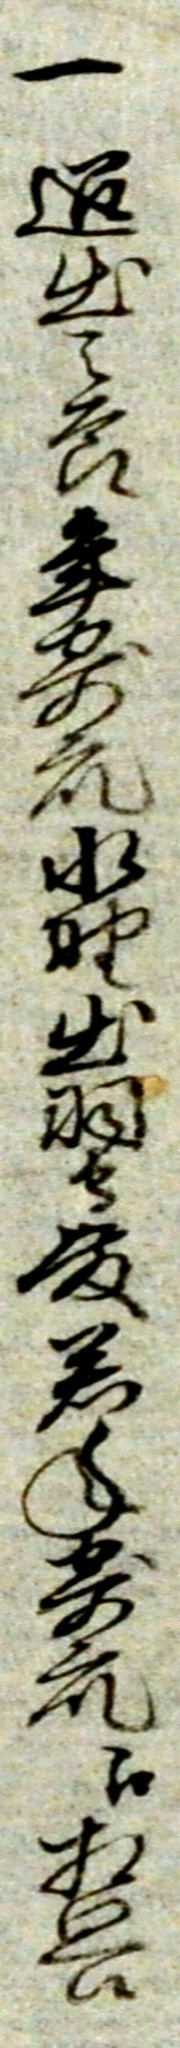一退出之節年寄衆水野出羽守殿若年寄衆江相廻候
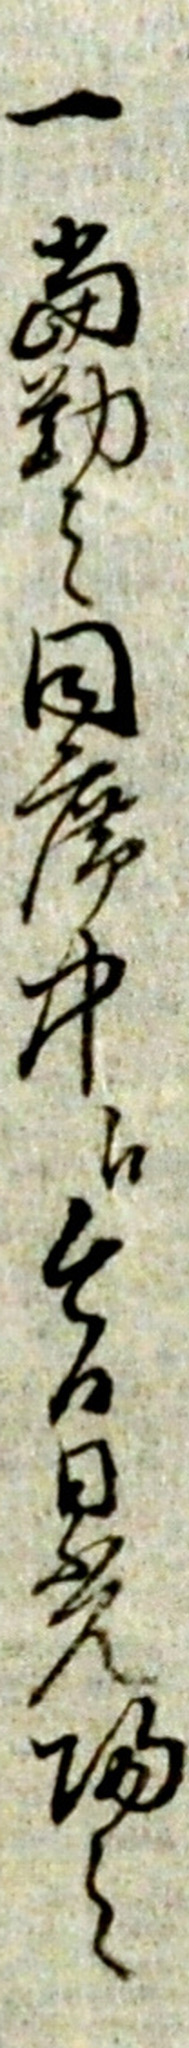一当勤者同席中江今日光帰之
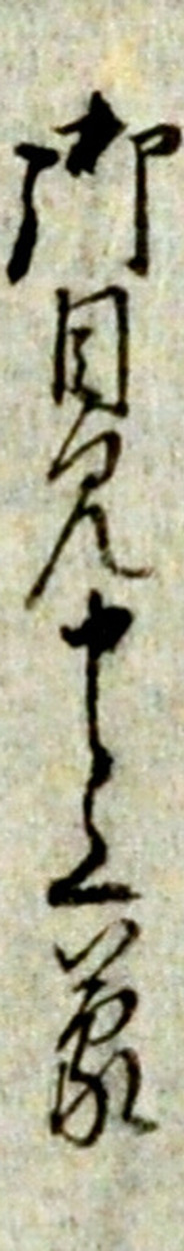御目見申上蒙
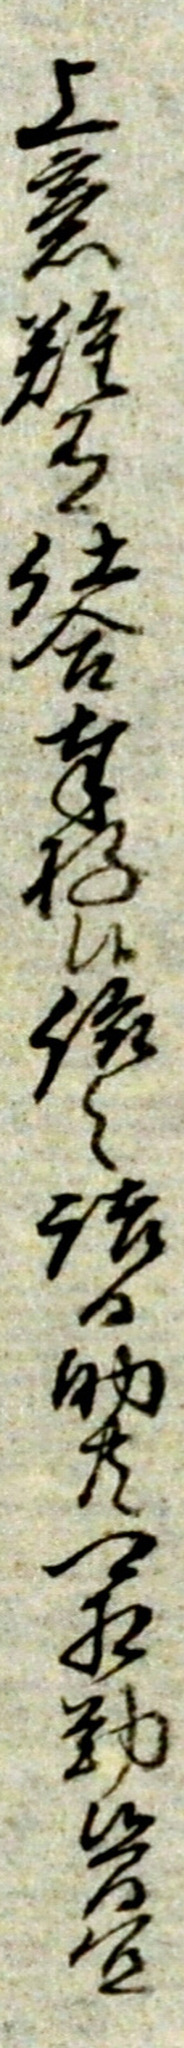上意難有仕合奉存候依之詰日助共可相勤皆宜
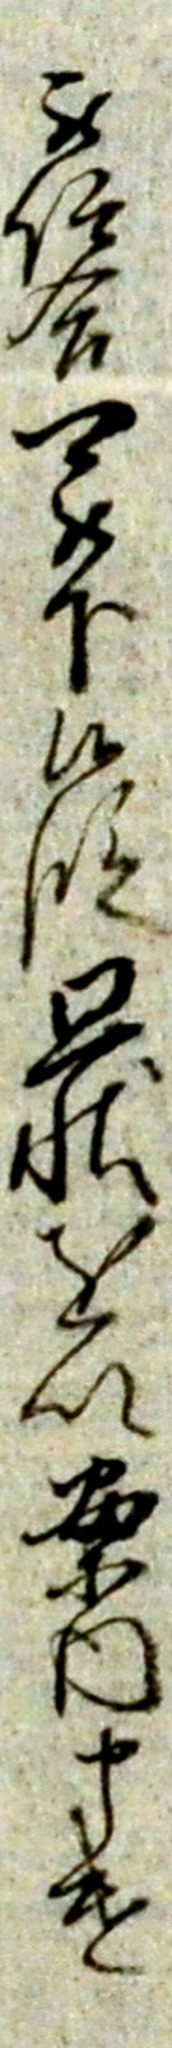被仰合可被下候段廻状を以案内申遣
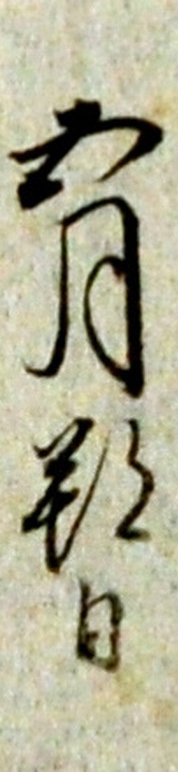五月朔日
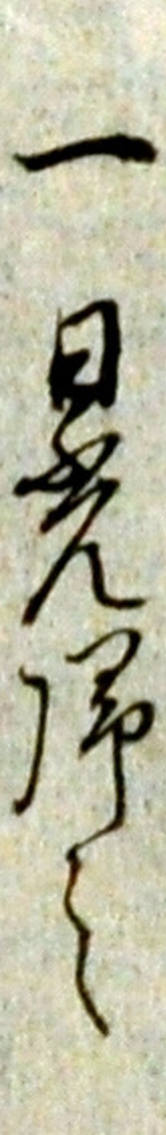一日光帰之
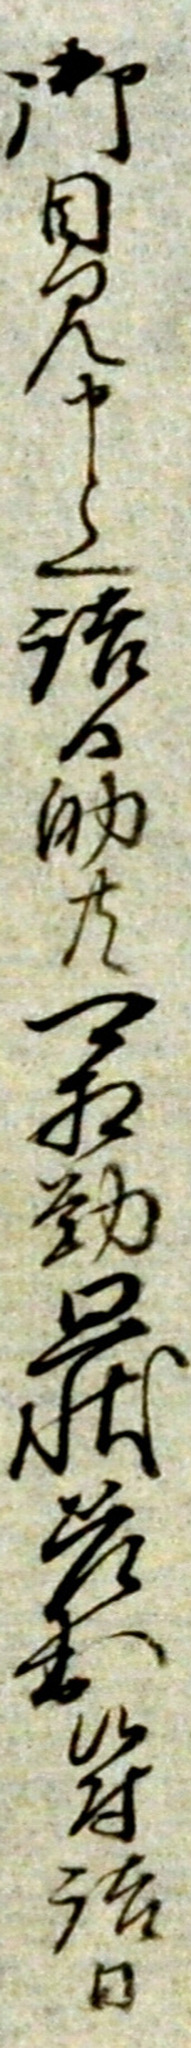御目見申上詰日助共可相勤廻状差出候付詰日
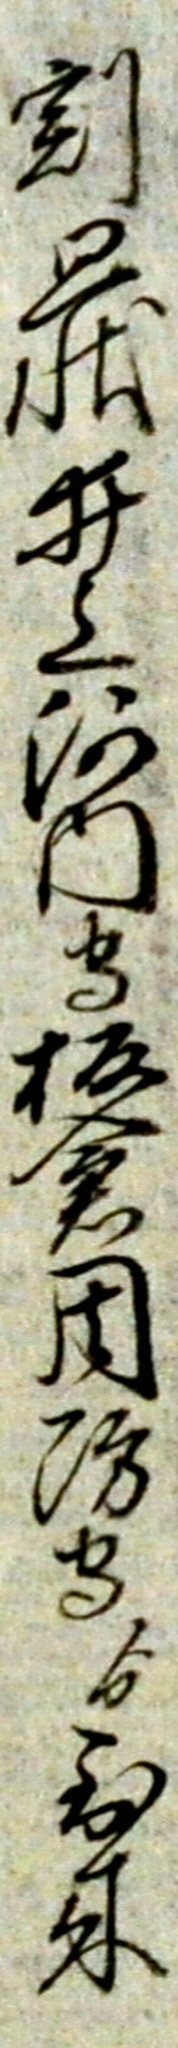割廻状井上河内守板倉周防守ゟ到来
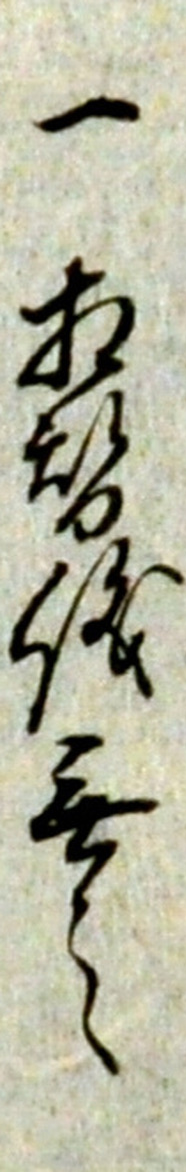一相替儀無之
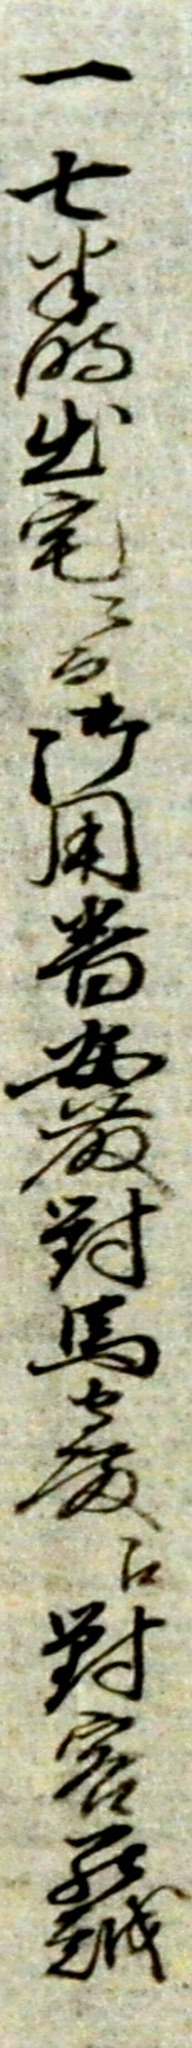一七半時出宅ニ而御用番安藤対馬守殿江対客罷越

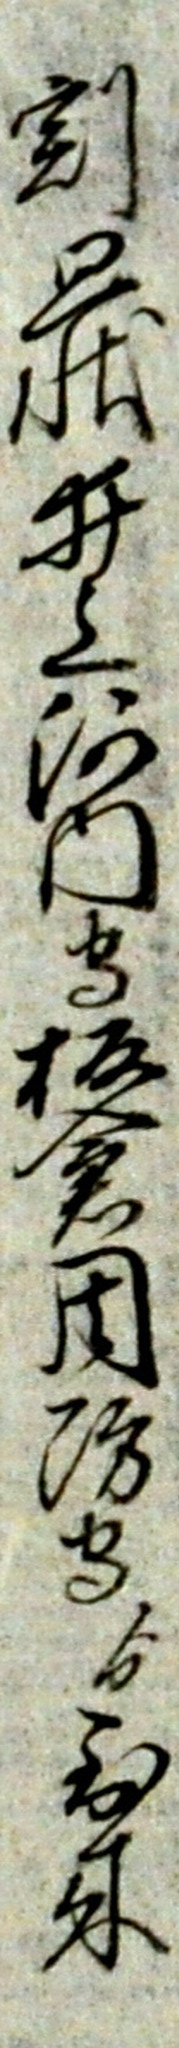割廻状井上河内守板倉周防守ゟ到来
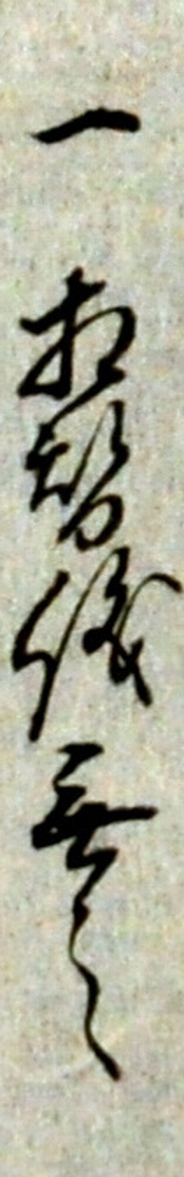一相替儀無之
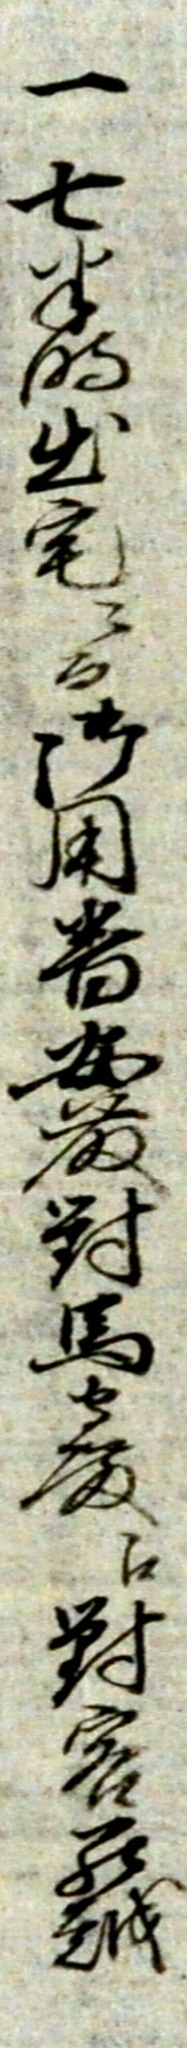一七半時出宅ニ而御用番安藤対馬守殿江対客罷越
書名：日光御名代相勤候節ノ留
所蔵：伊那市立高遠町図書館・合同会社AMANE
